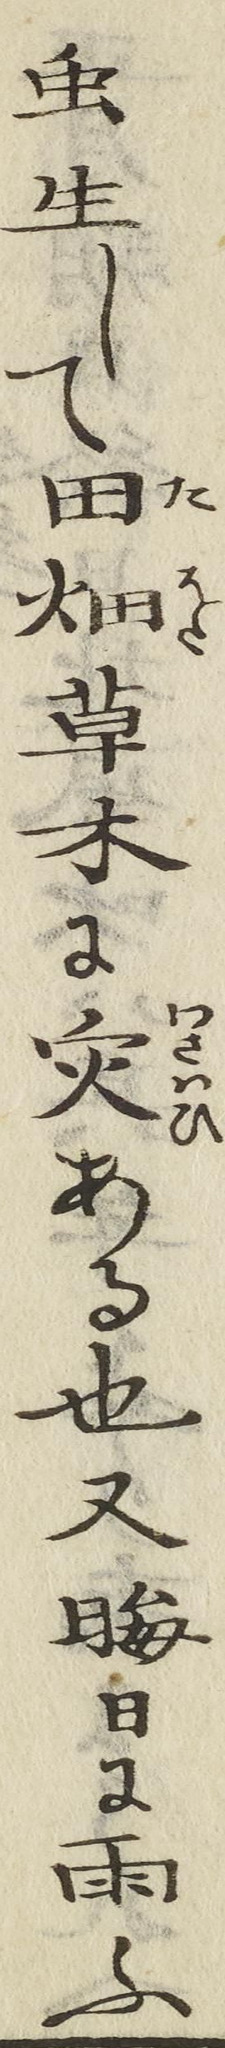虫生して田畑草木に災ある也又晦日に雨ふ
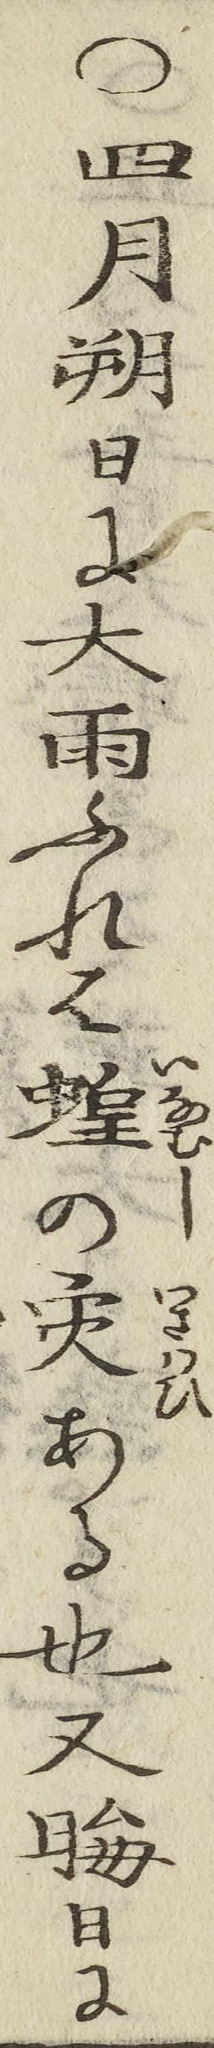〇四月朔日に大雨ふれは蝗の災ある也又晦日に
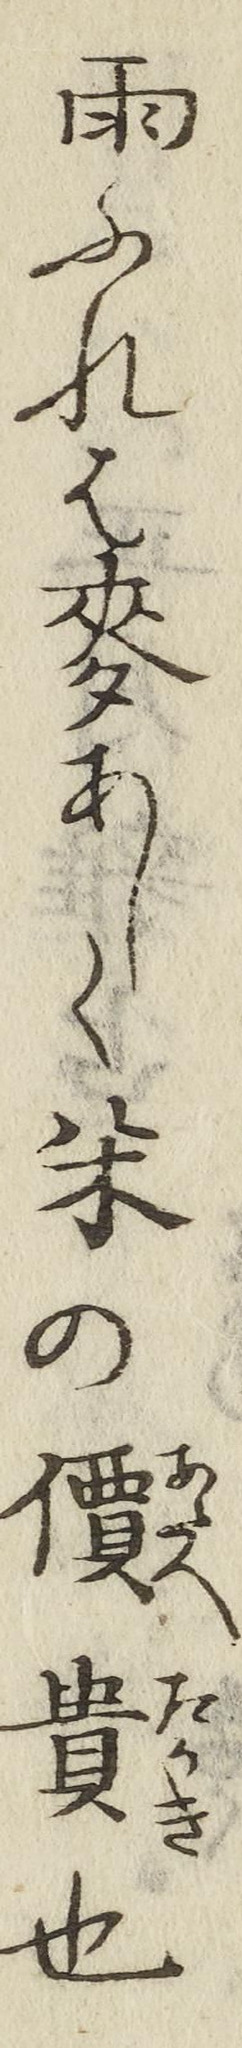雨ふれは麦あしく米の価貴也
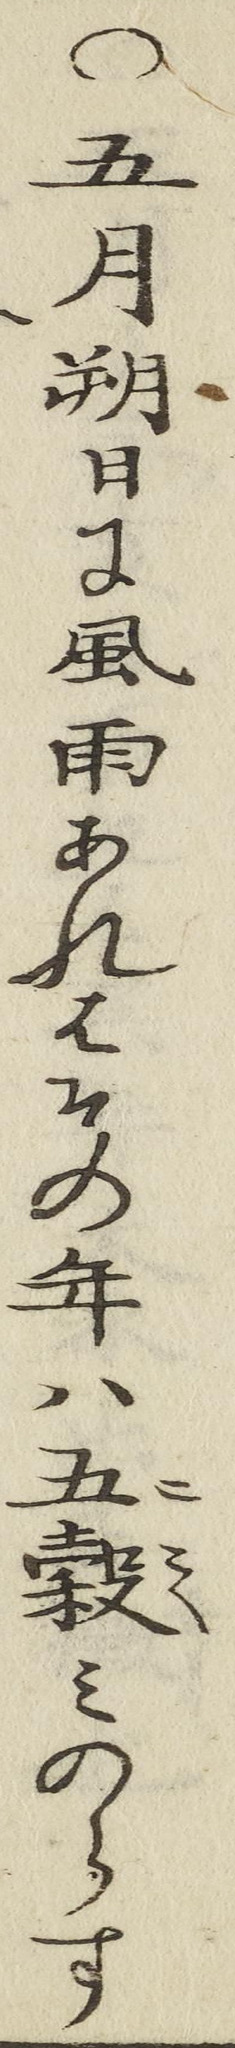〇五月朔日に風雨あれはその年は五穀みのらす
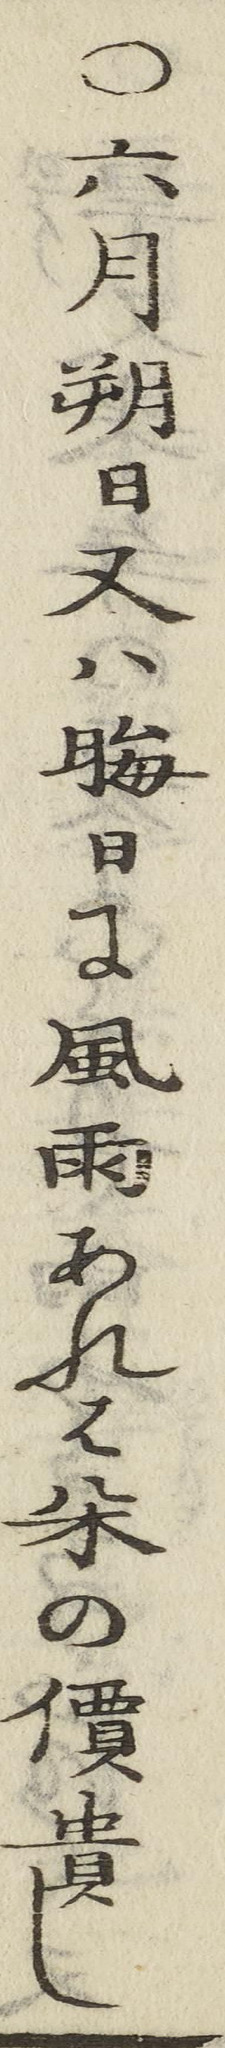〇六月朔日又は晦日に風雨あれは米の価貴し
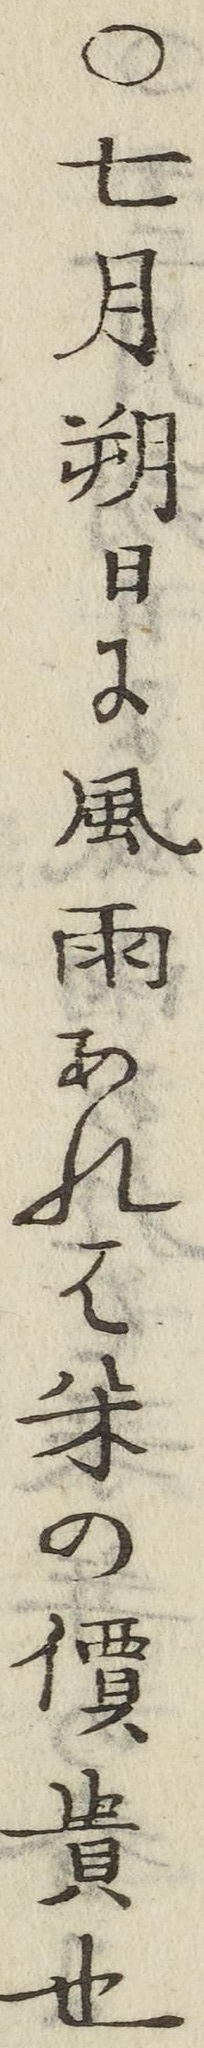〇七月朔日に風雨あれは米の価貴也
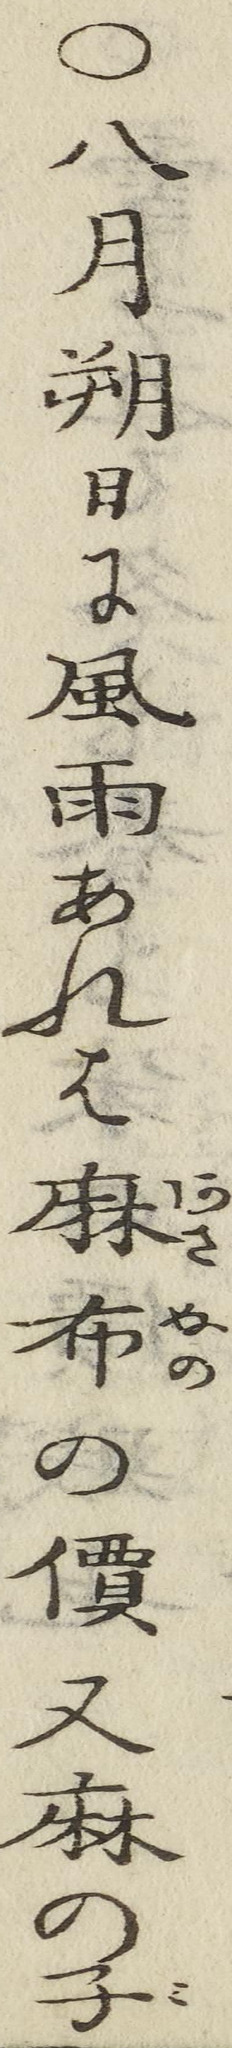〇八月朔日に風雨あれは麻布の価又麻の子
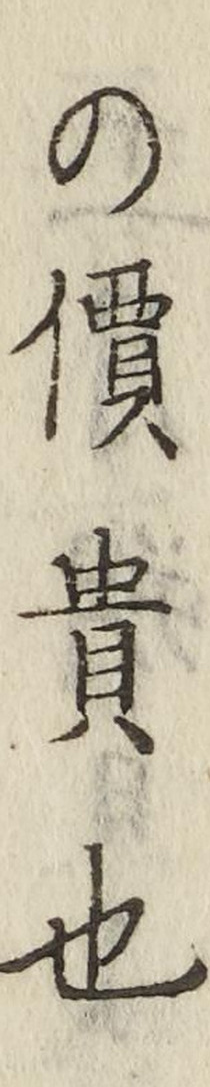の価貴也
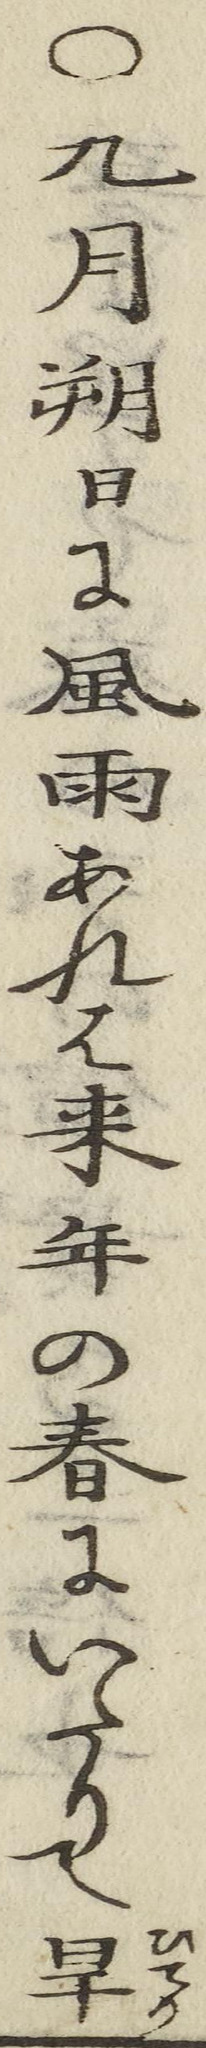〇九月朔日に風雨あれは来年の春にいたりて旱
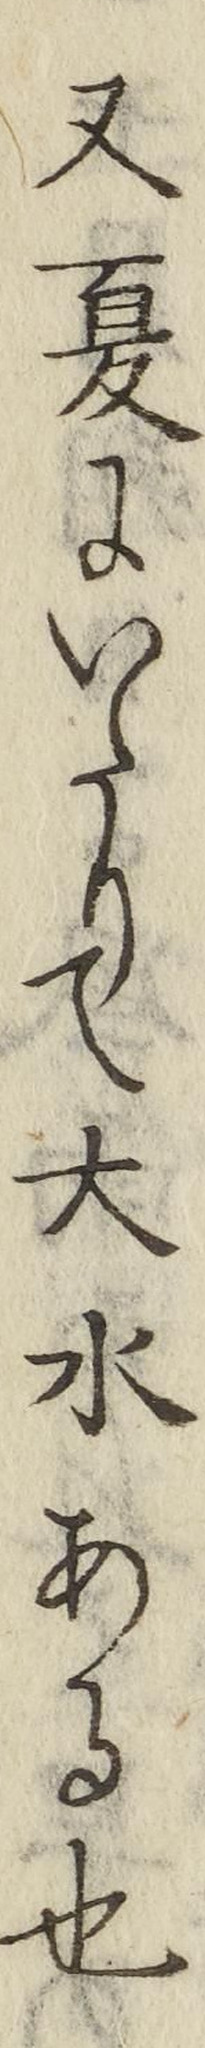又夏にいたりて大水ある也

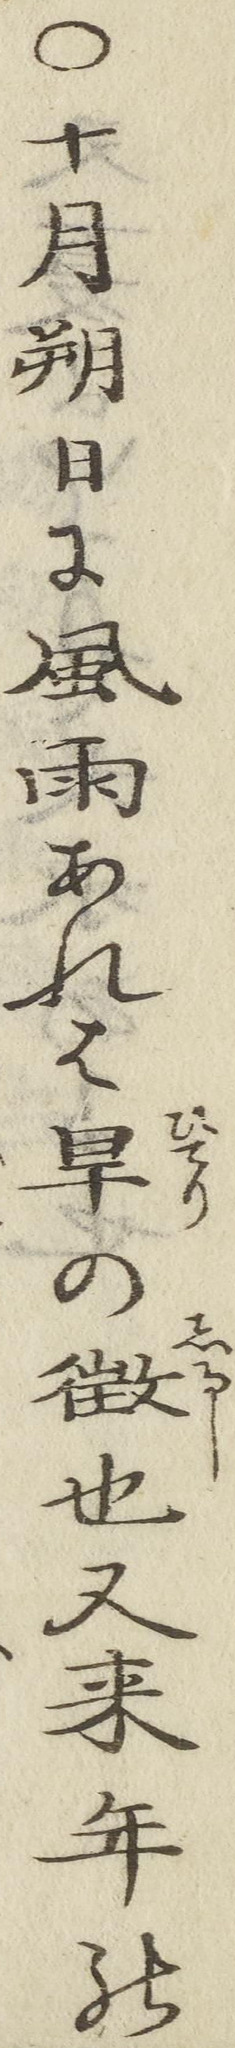〇十月朔日に風雨あれは旱の徴也又来年の
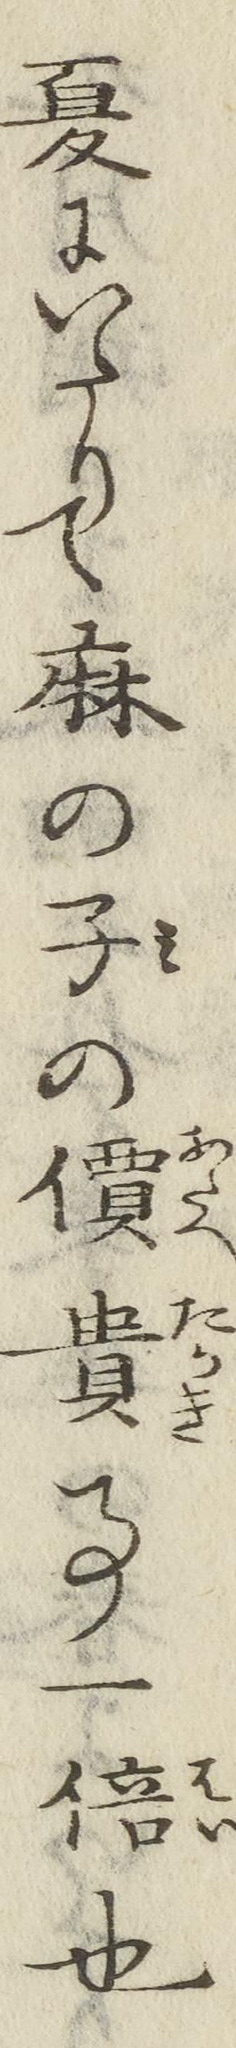夏にいたりて麻の子の価貴事一倍也
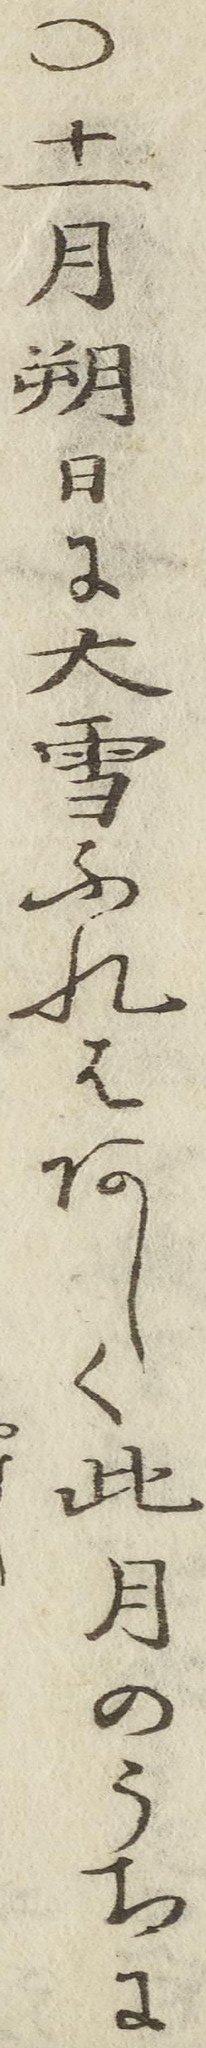〇十一月朔日に大雪ふれはあしく此月のうちに
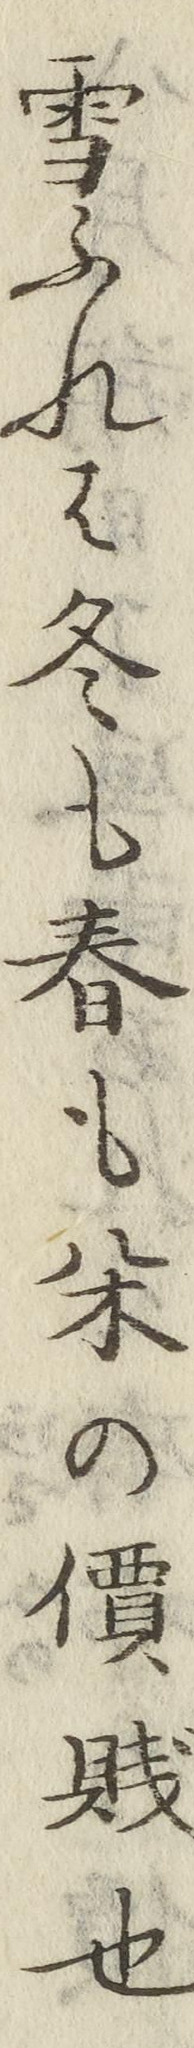雪ふれは冬も春も米の価賤也
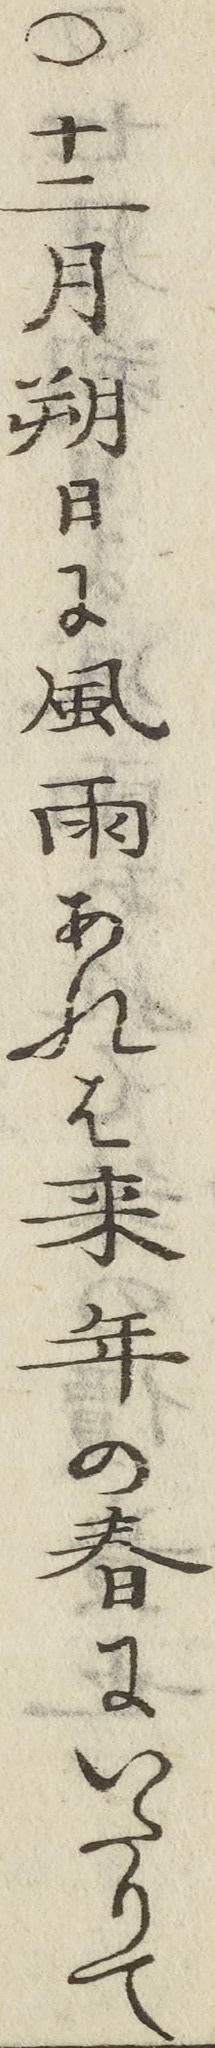〇十二月朔日に風雨あれは来年の春にいたりて
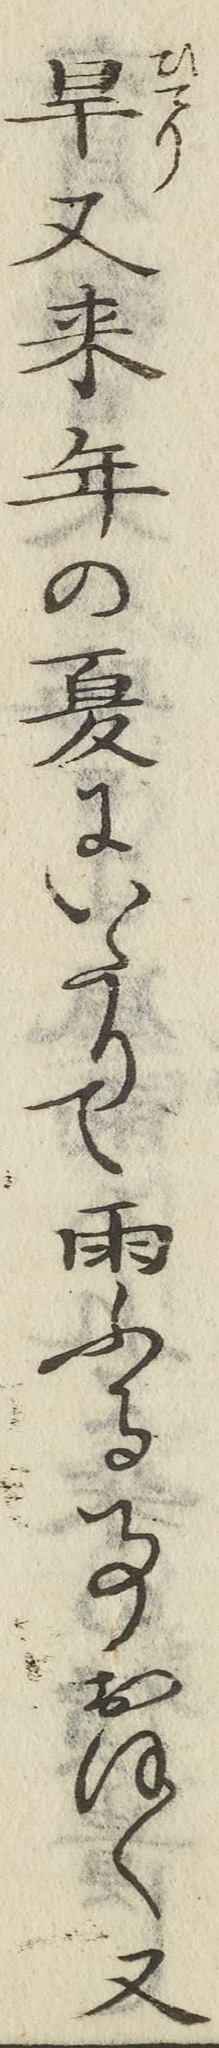旱又来年の夏にいたりて雨ふる事おほく又
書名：天時占候　二
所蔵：東京大学地震研究所図書室 Earthquake Research Institute Library, The University of Tokyo, JAPAN
